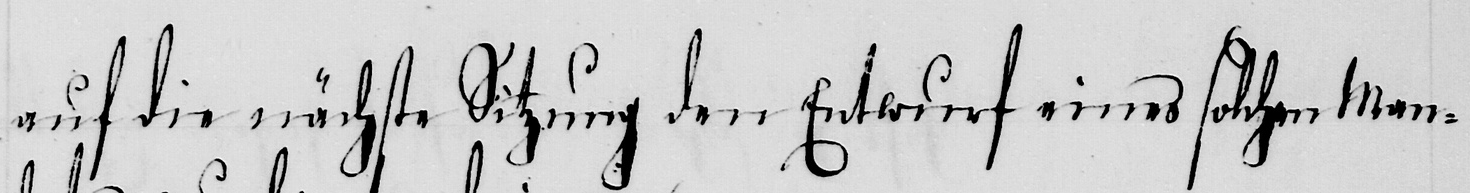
auf die nächste Sitzung den Entwurf eines solchen Man¬
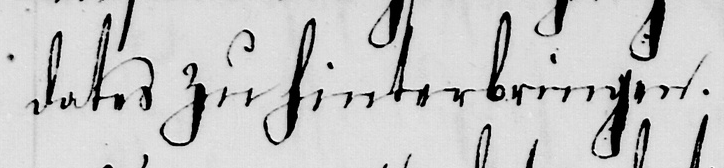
dates zu hinterbringen.
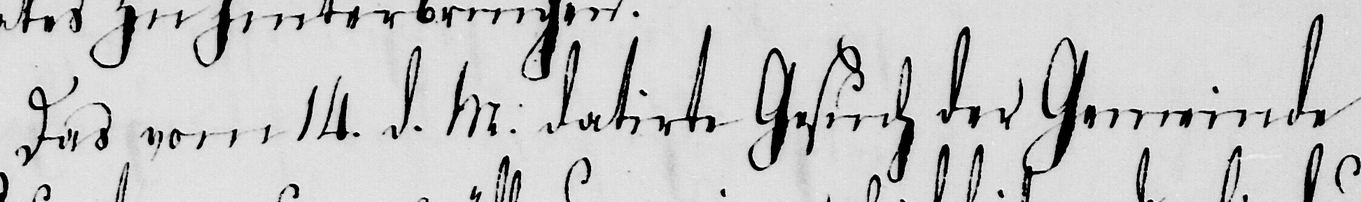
Das vom 14. d. M. datirte Gesuch der Gemeinde
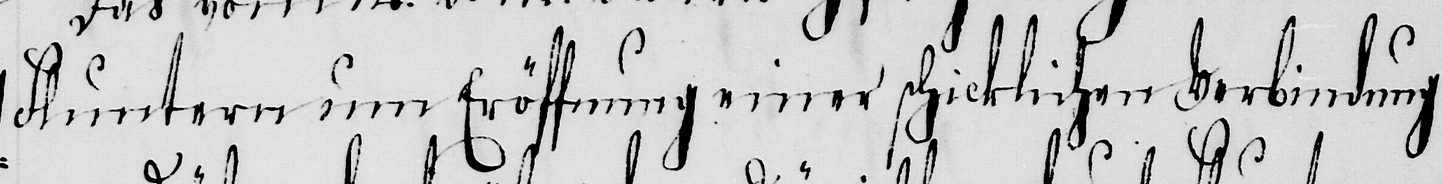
Fluntern um Eröffnung einer schicklichen Verbindung
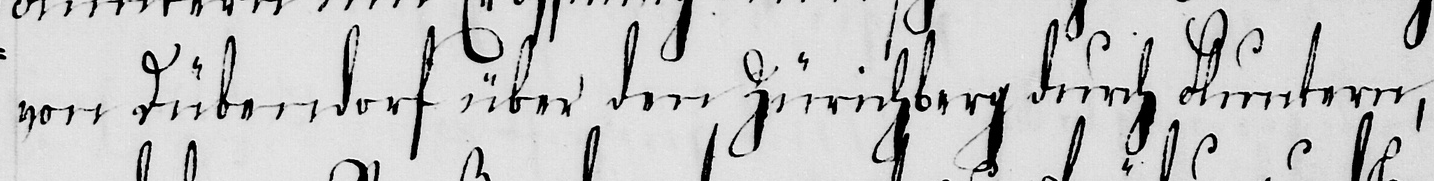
von Dübendorf über den Zürichberg durch Fluntern,
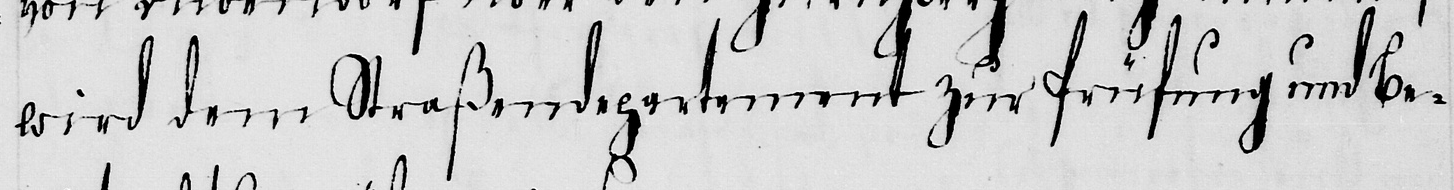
wird dem Straßendepartement zur Prüfung und Be¬
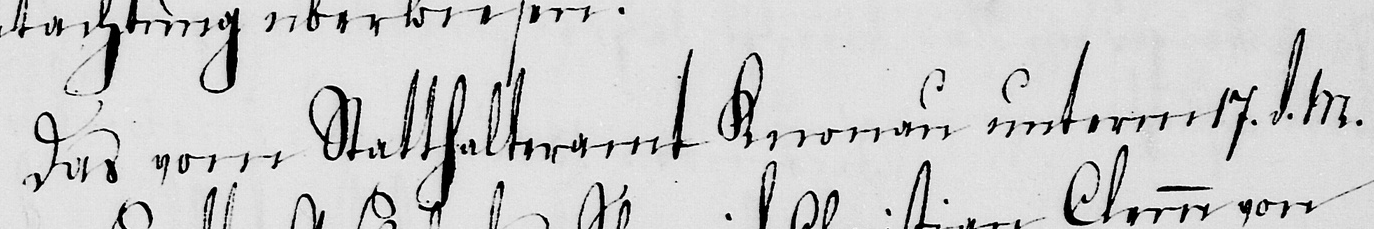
Das vom Statthalteramt Knonau unterm 17. d. M.
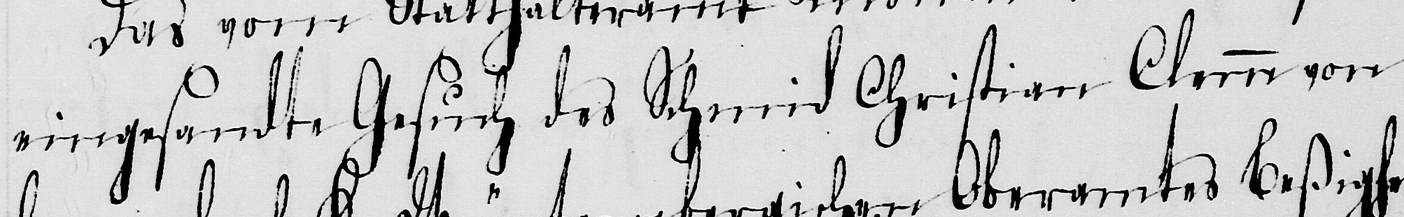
eingesandte Gesuch des Schmid Christian Clemm von
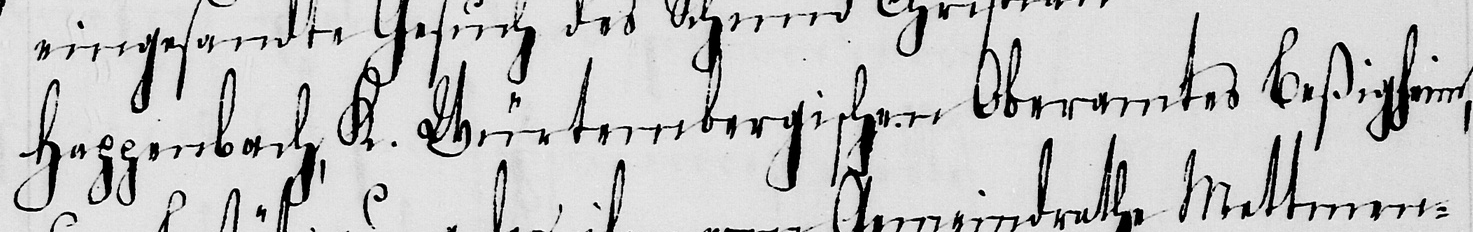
Happenbach, K. Würtembergischen Oberamtes Beßigheim,
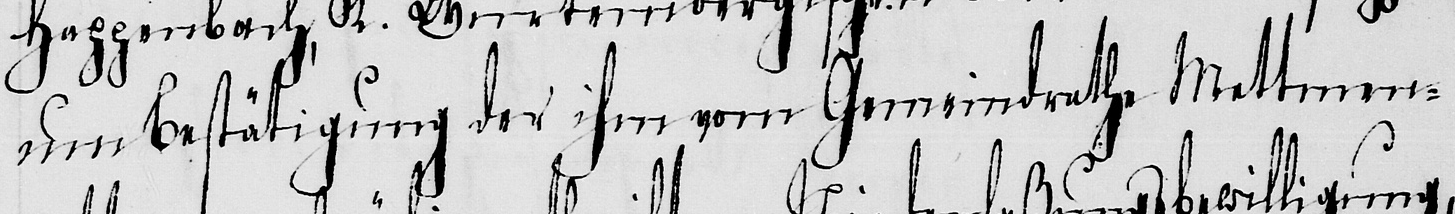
um Bestätigung der ihm von Gemeindrathe Mettmen¬
